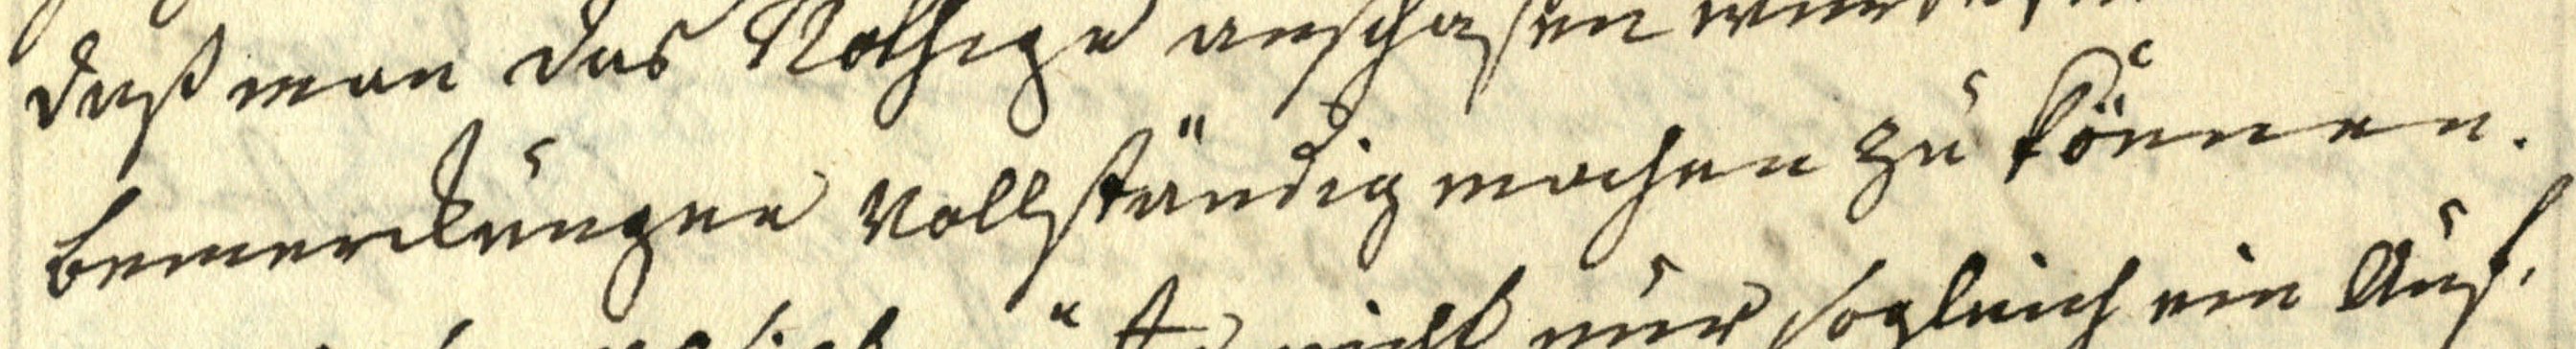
Bemerckungen vollständig machen zu können.
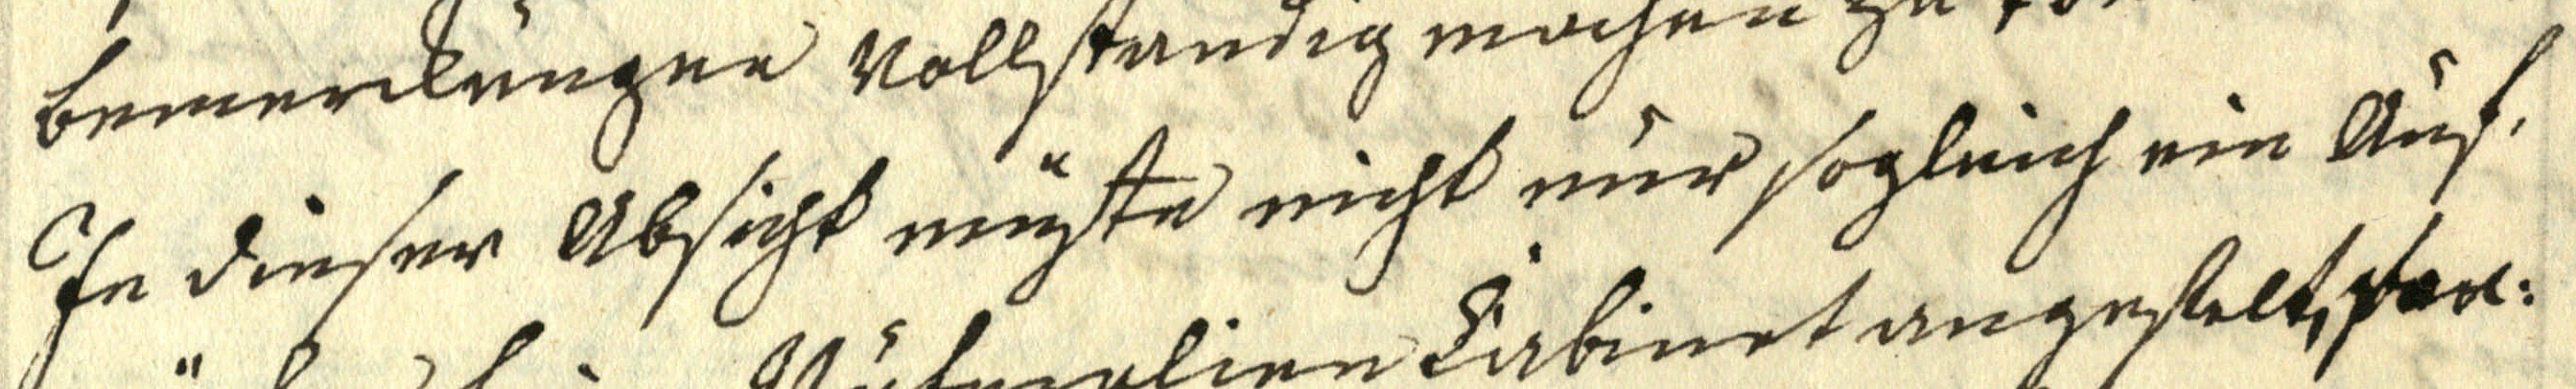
In dieser Absicht müßte nicht nur sogleich ein Auf¬
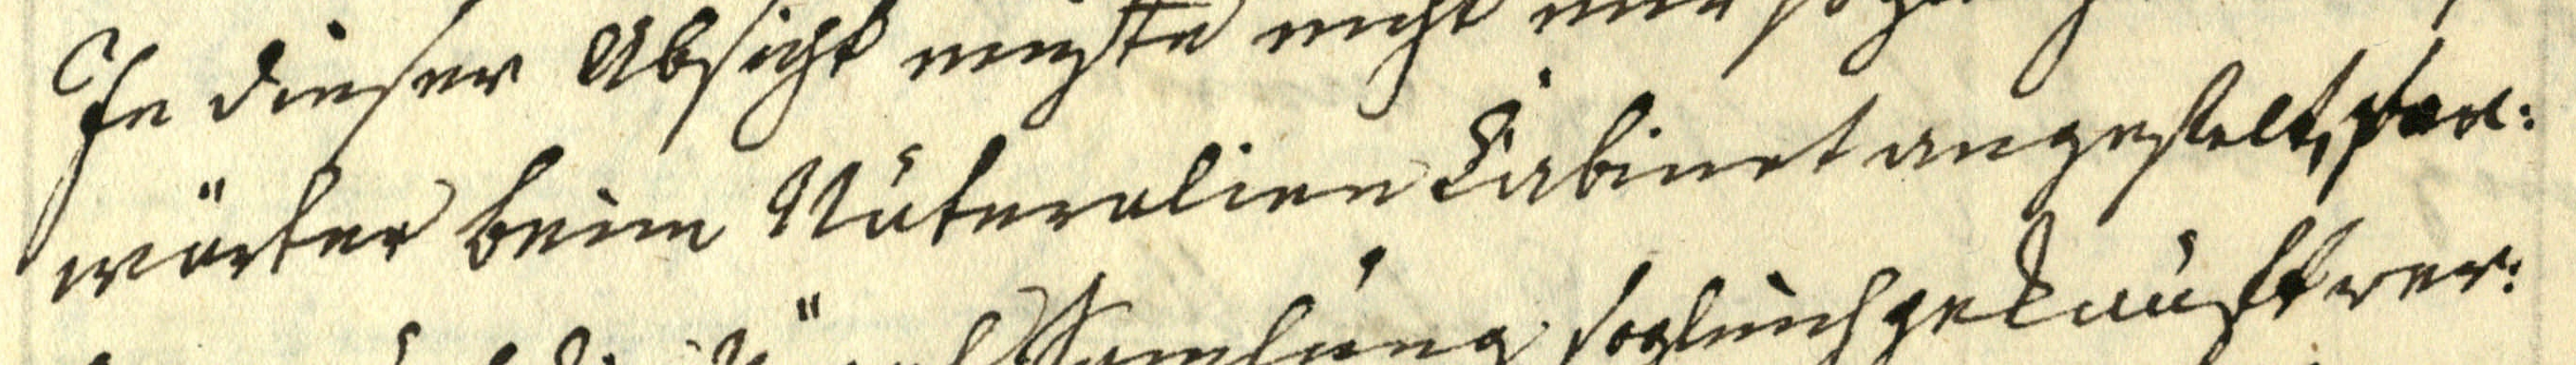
wärter beim Naturalien Cabinet angestelt, son¬
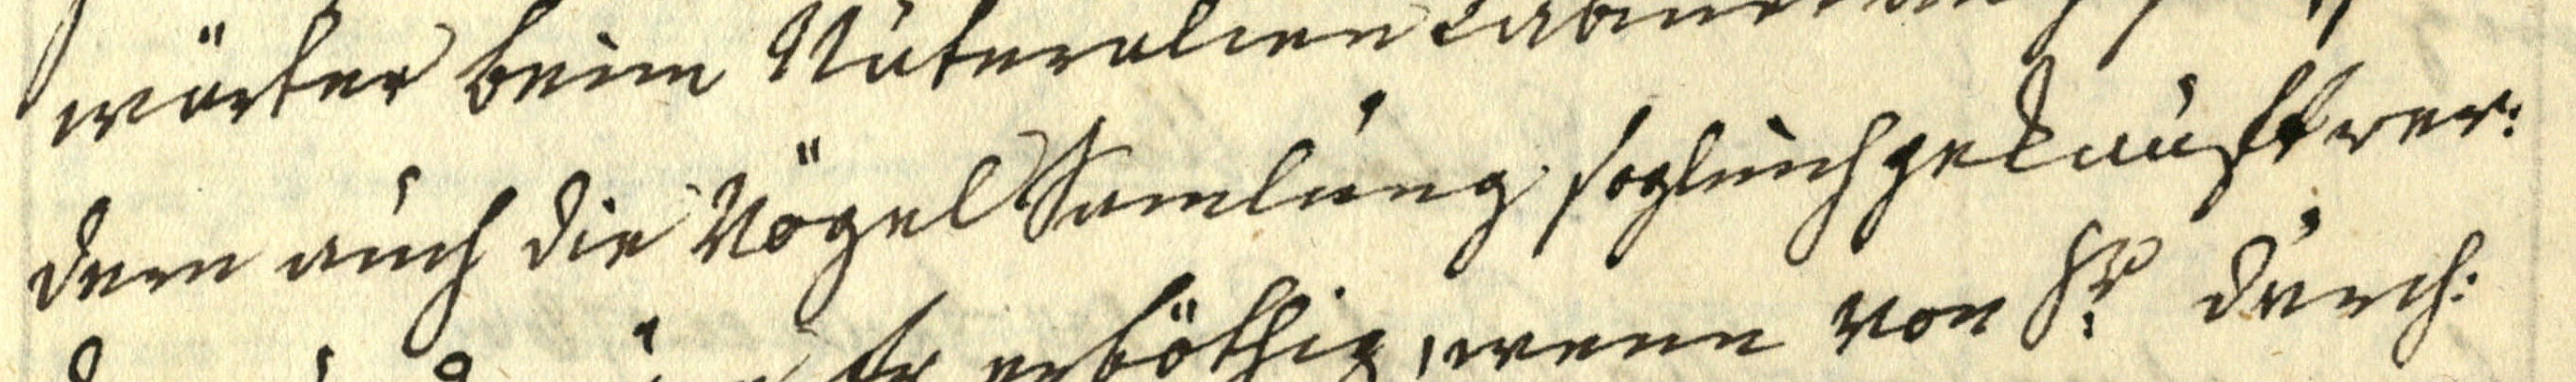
dern auch die Vögel Samlung sogleich gekauft wer¬
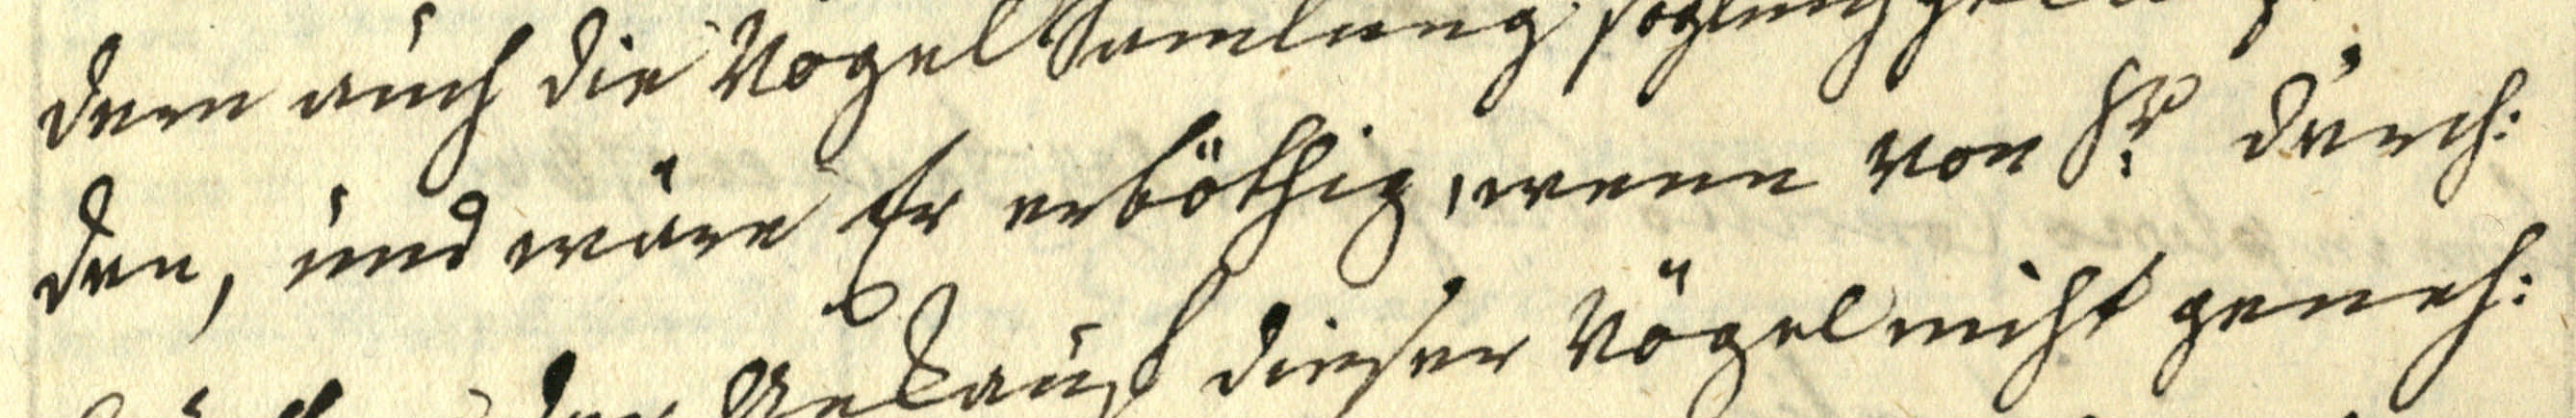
den, und wäre Er erböthig, wenn von Sr Durch¬
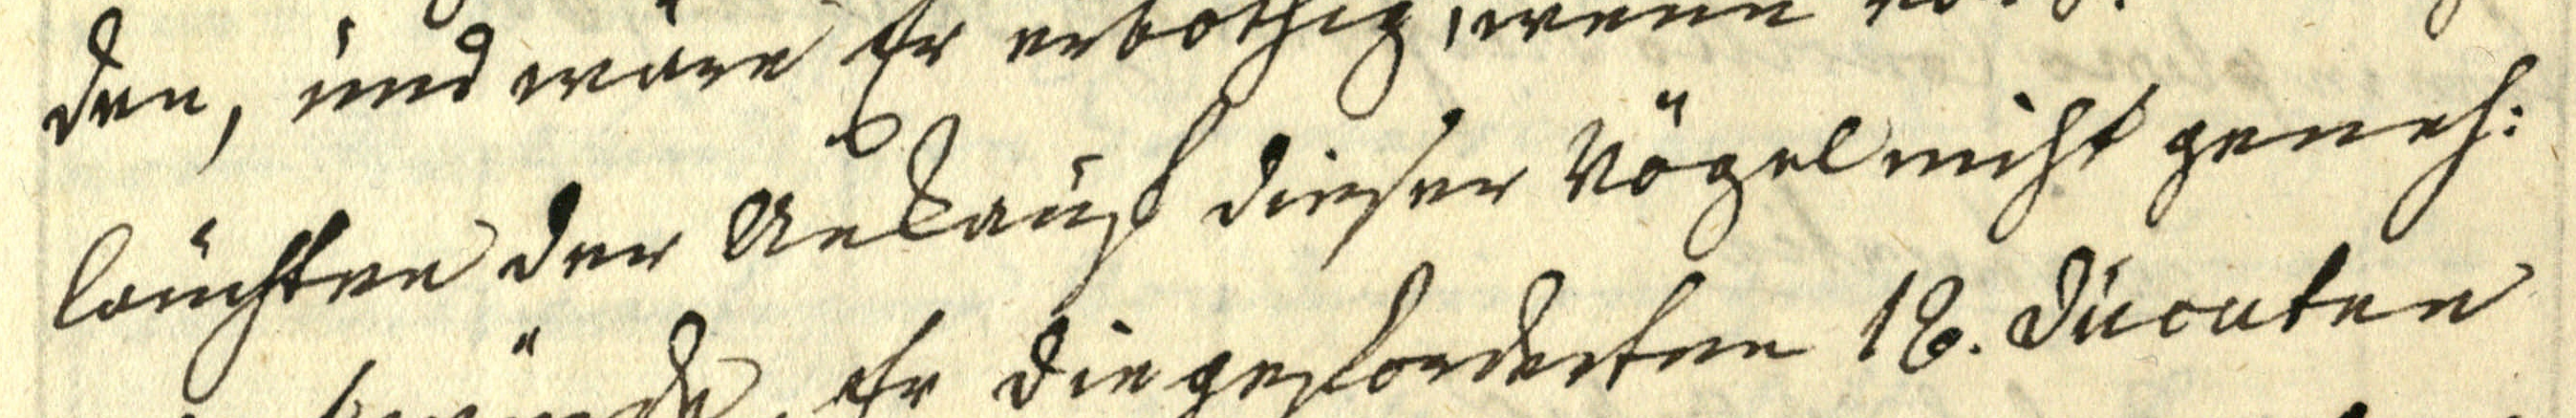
lauchten der Ankauf dieser Vögel nicht geneh¬
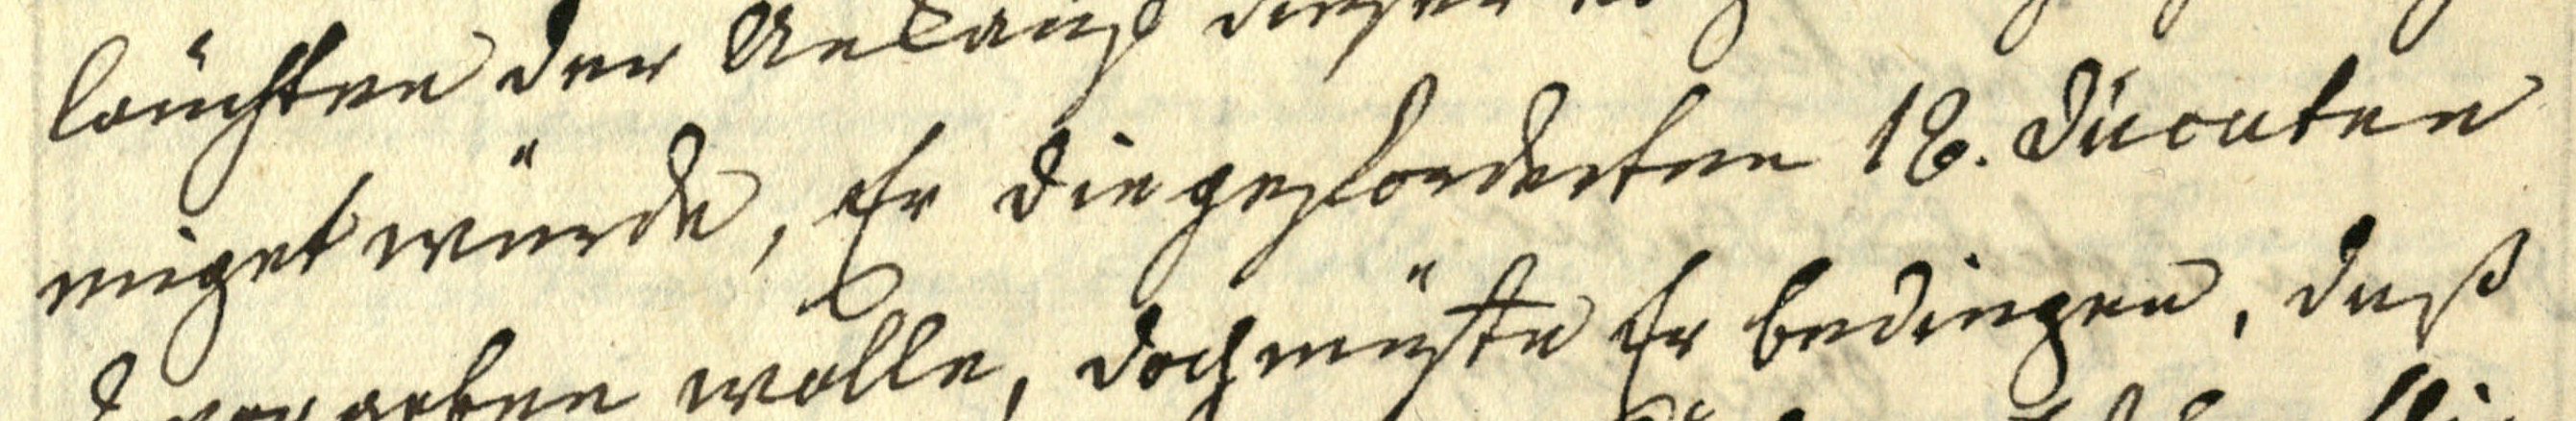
miget würde, Er die geforderten 18. Ducaten
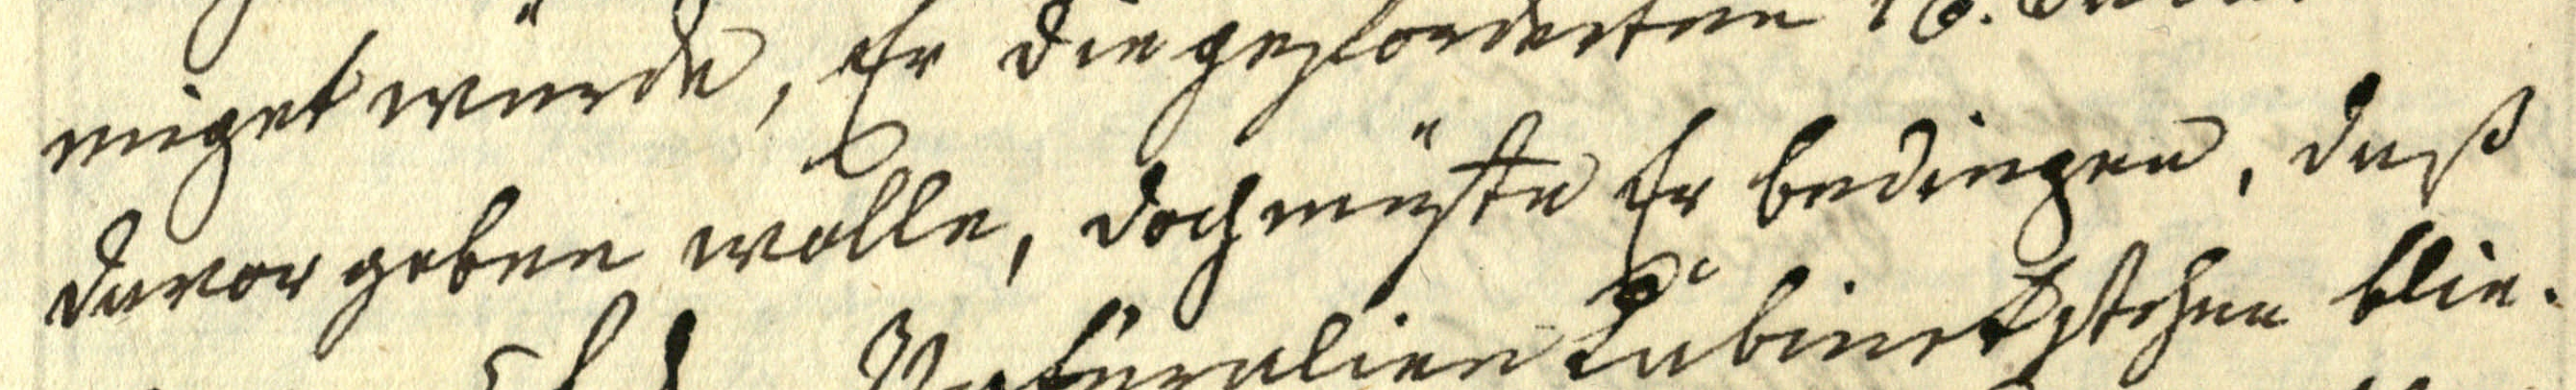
davor geben wolle, doch müste Er bedingen, daß
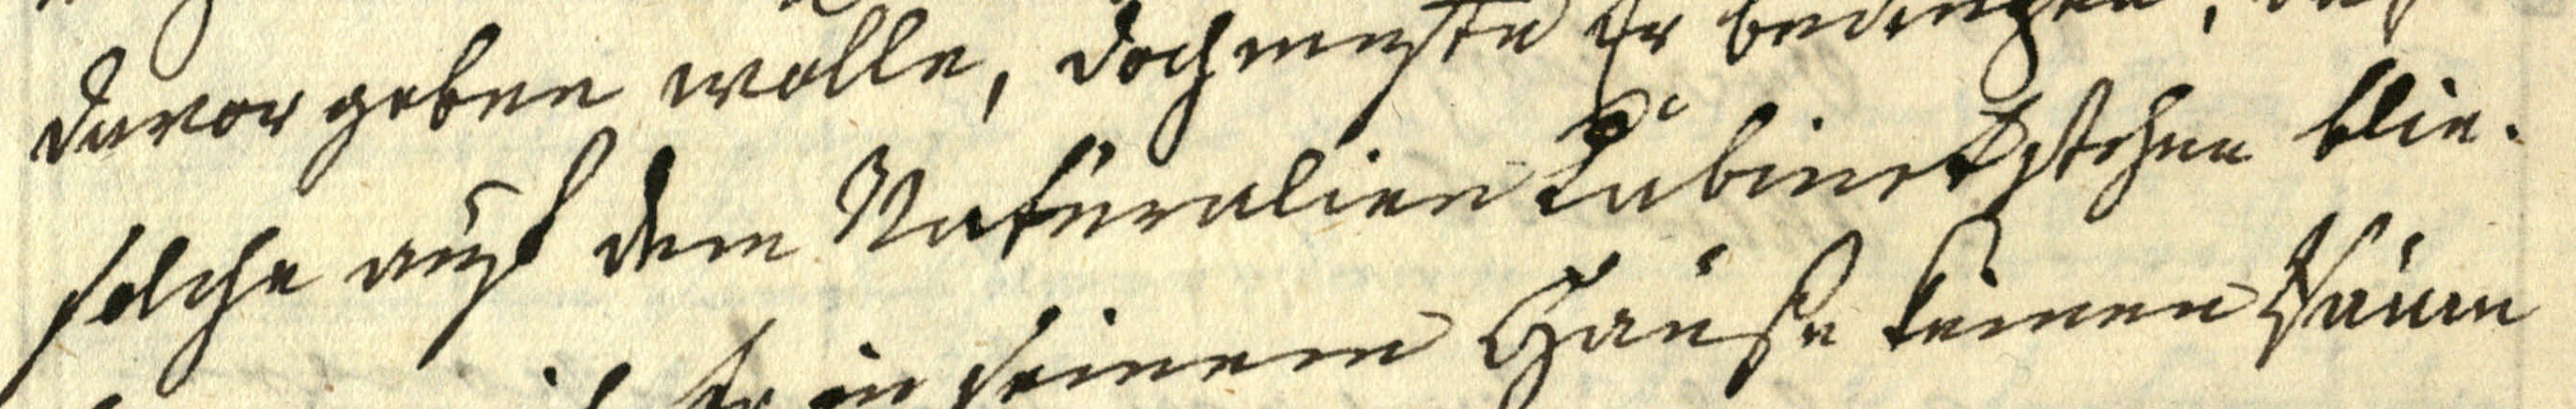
solche auf dem Naturalien Cabinet stehen blie¬
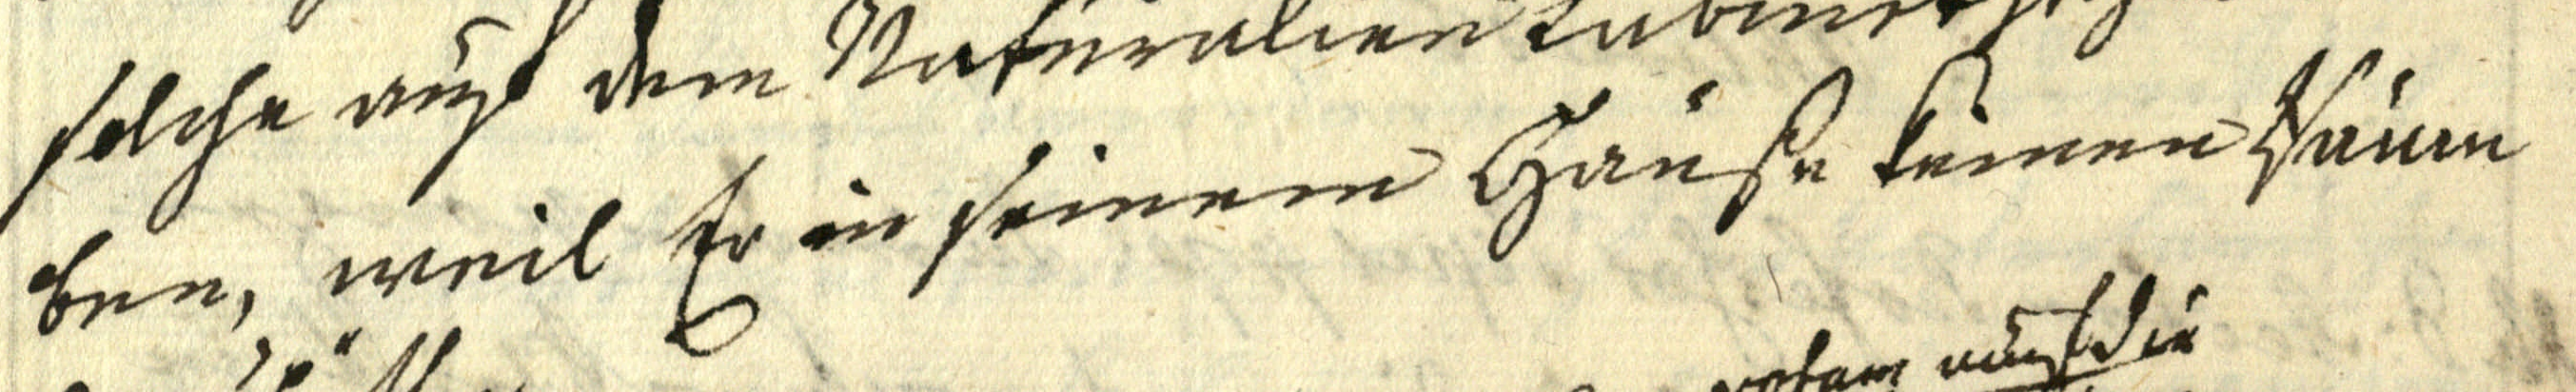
ben, weil Er in seinem Hauße keinen Raum
